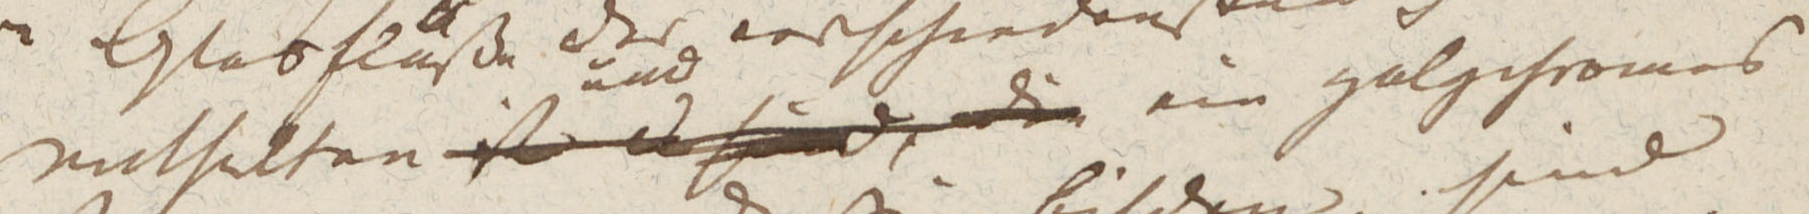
enthalten ist d sind, die und ein polychromes
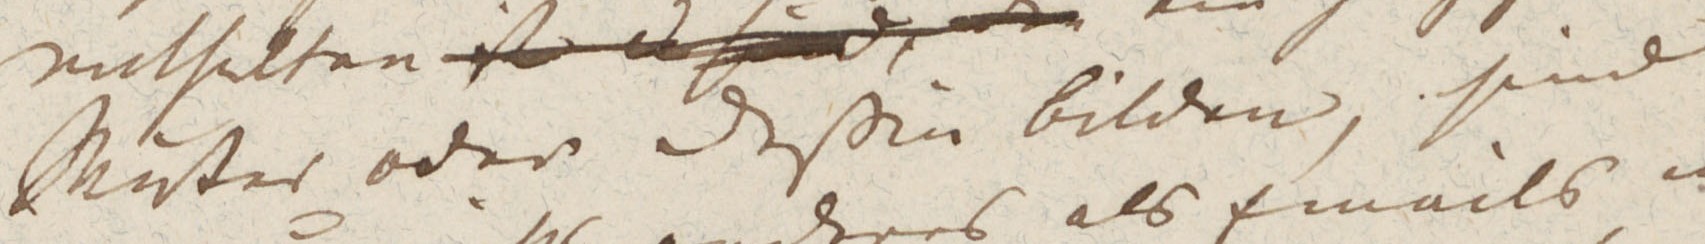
Muster oder Dessin bilden, sind
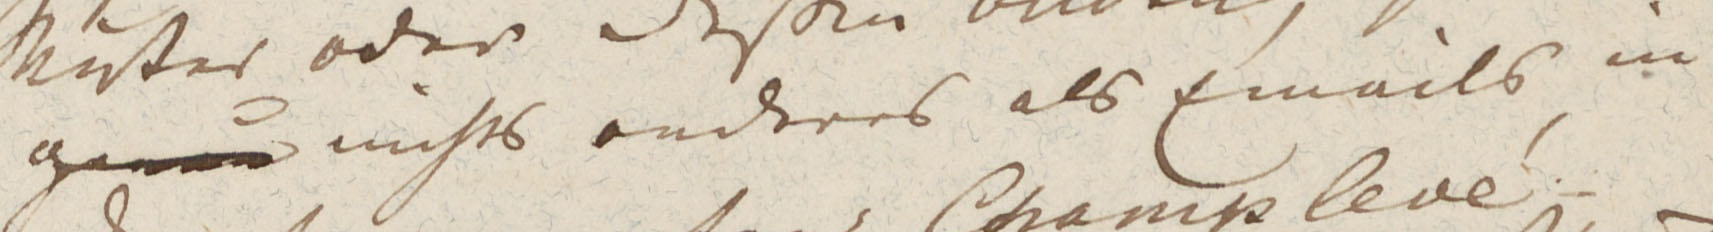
genau nichts anderes als Emails in
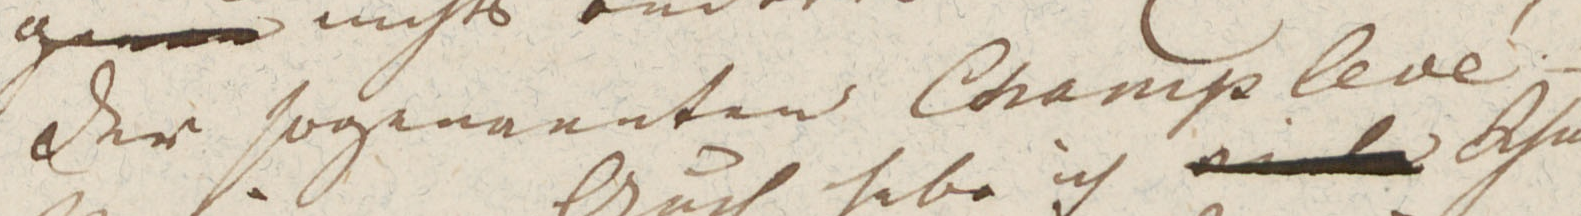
der sogenannten Champlevé-
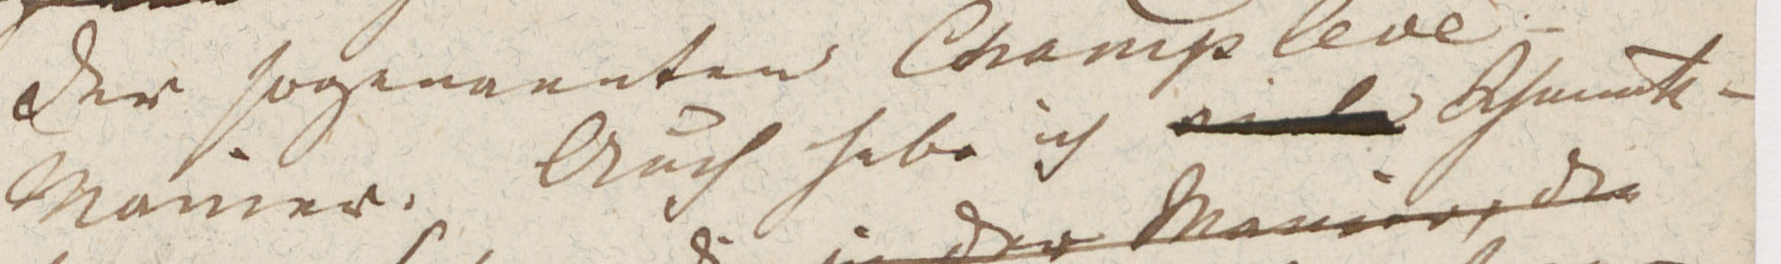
Manier. Auch habe ich viele Schmuck-
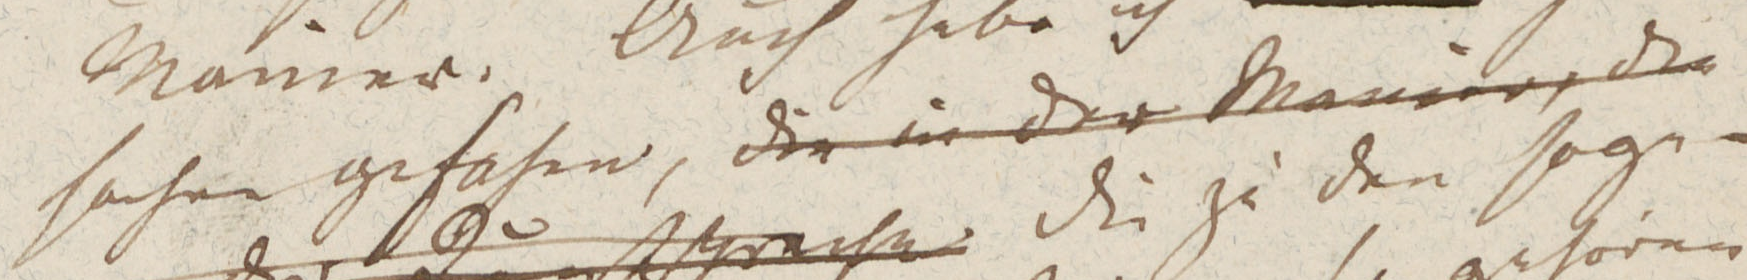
sachen gefehen, die in der Manier, die
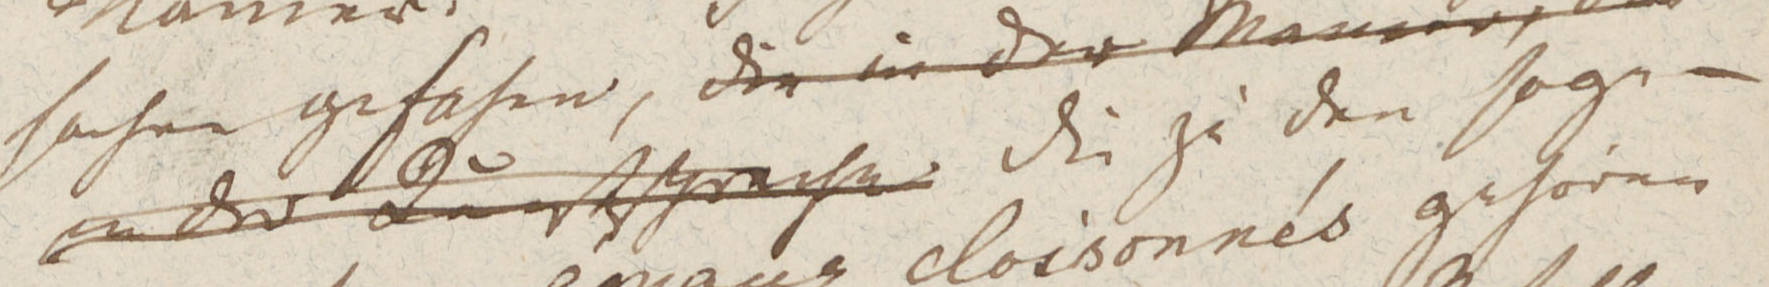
in der Kunstsprache die zu den soge-
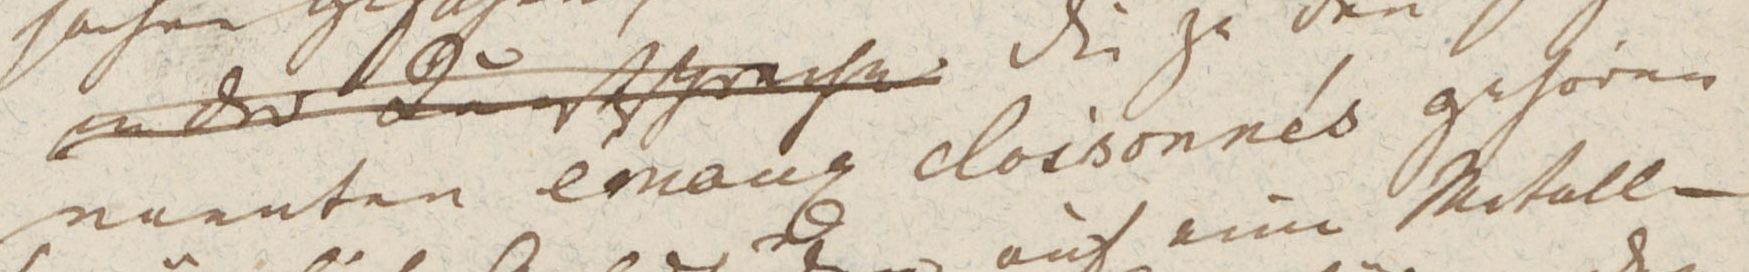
nannten émaux cloisonnés gehören
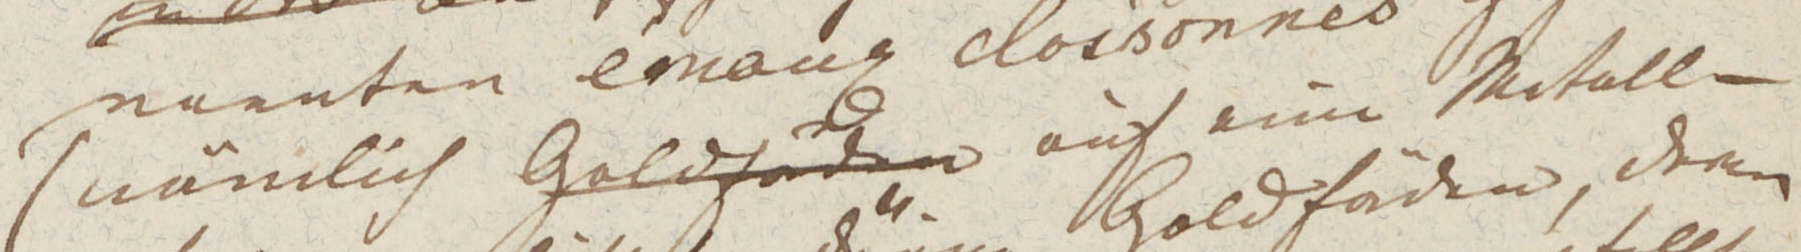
(nämlich Goldfäden auf eine Metall-
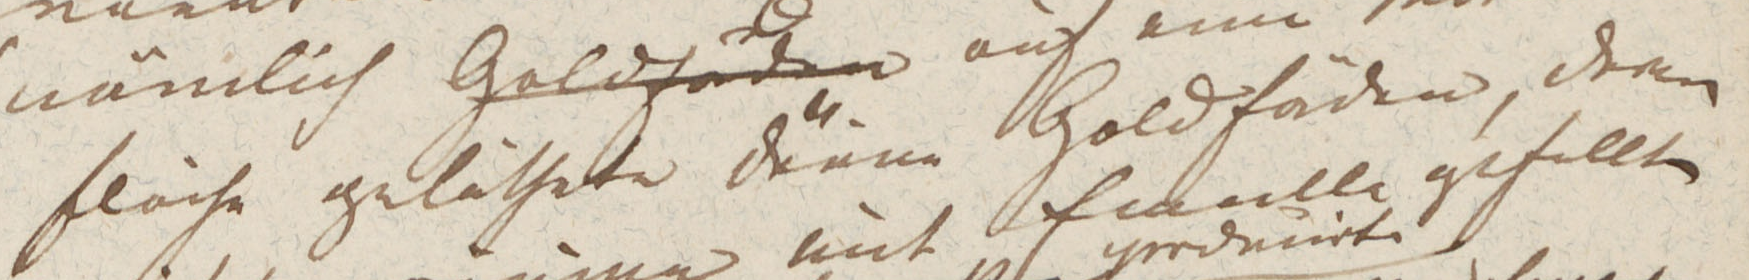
fläche gelöthete dünne Goldfäden, deren
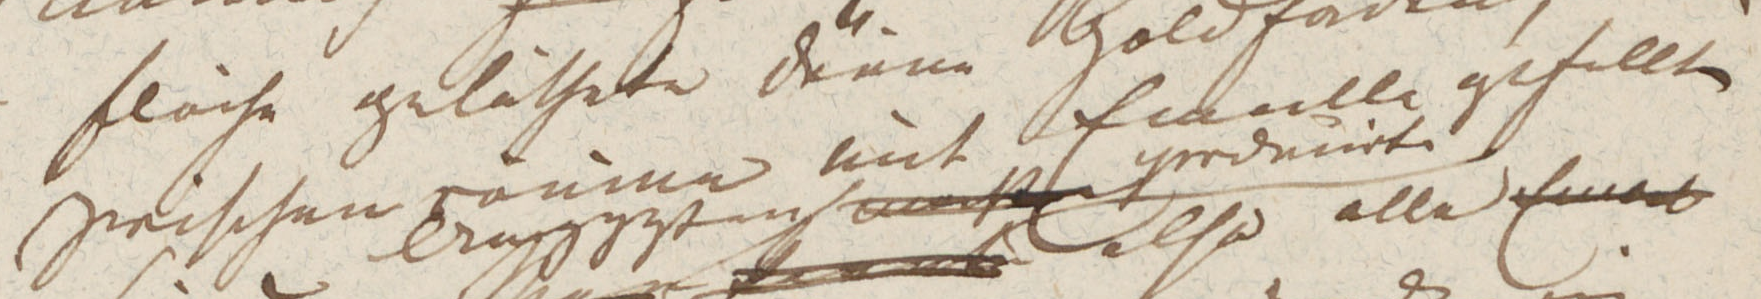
Zwischenräume mit Emaille gefullt
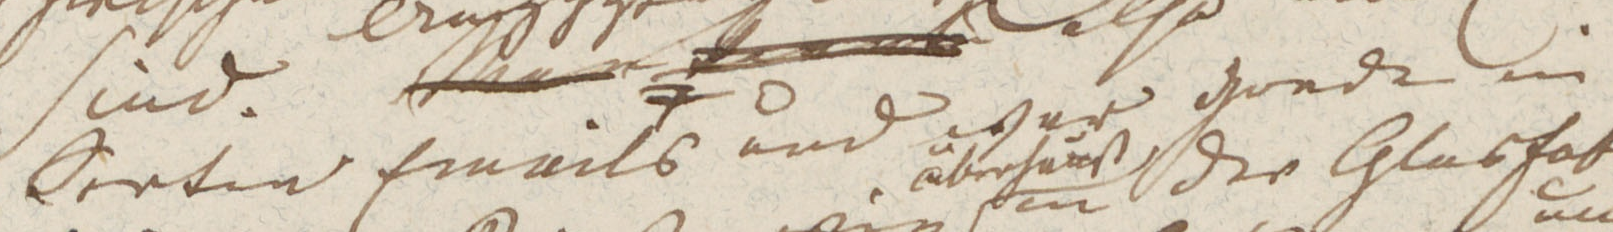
Sorten Emails % und war grade in
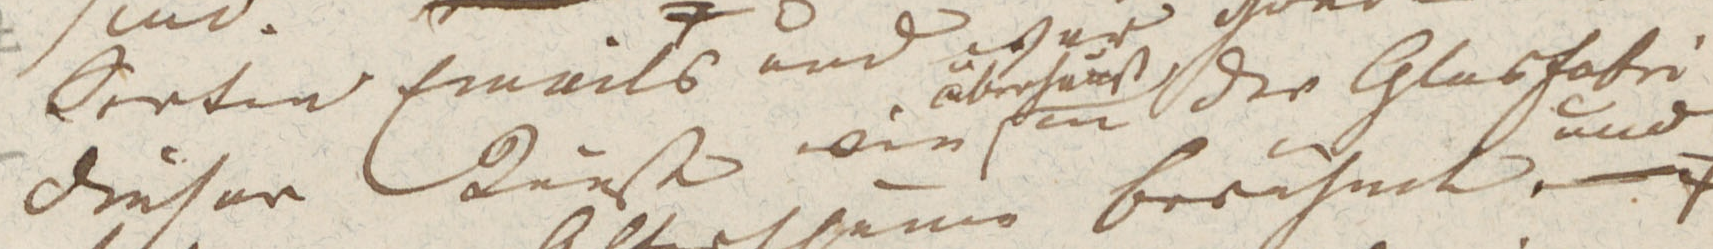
dieser Kunst wie überhaupt in der Glasfabri
